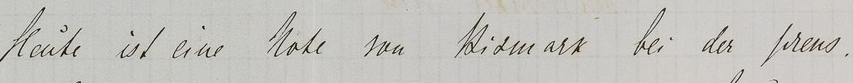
Heute ist eine Note von Bismark bei der preus-
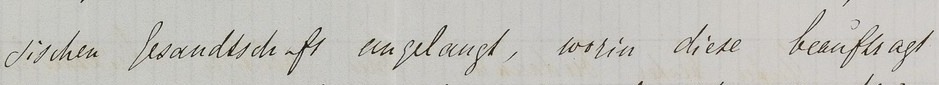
sischen Gesandtschaft angelangt, worin diese beauftragt
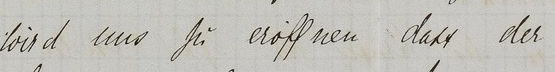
wird uns zu eröffnen dass der
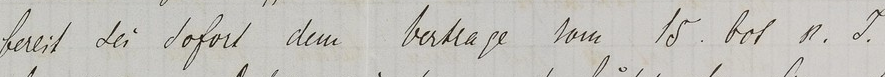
bereit sei sofort dem Vertrage vom 15. Oct. v. J.
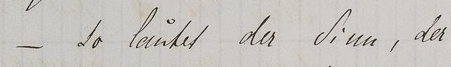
– so lautet der Sinn, der
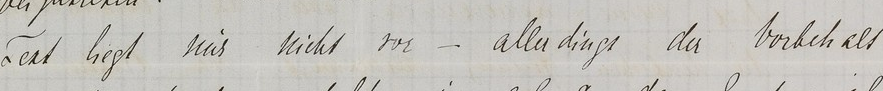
Text liegt mir nicht vor – allerdings der Vorbehalt
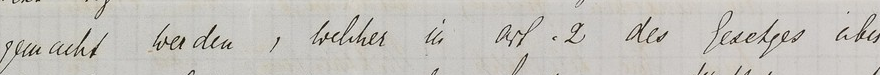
gemacht werden, welcher in Art. 2 des Gesetzes über
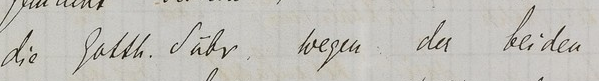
die Gotth.Subv. wegen der beiden
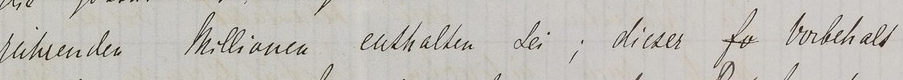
rührenden Millionen enthalten sei; dieser fo Vorbehalt
